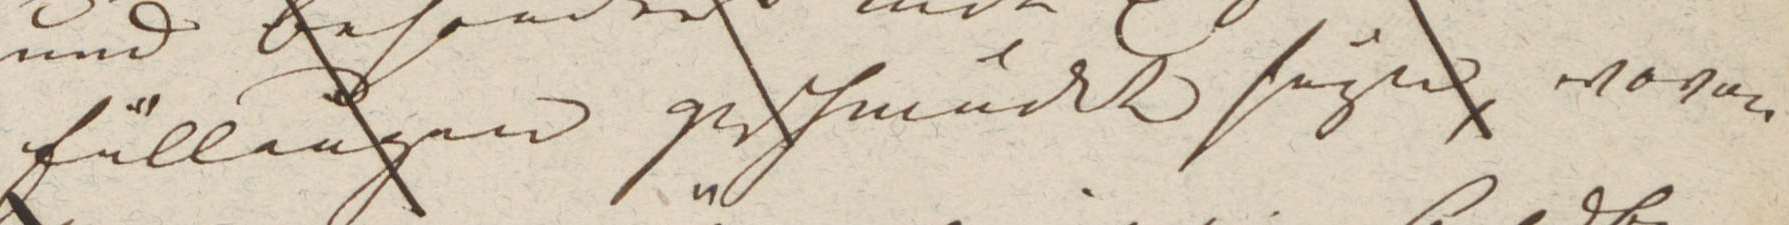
füllungen geschmückt seyn, wovon
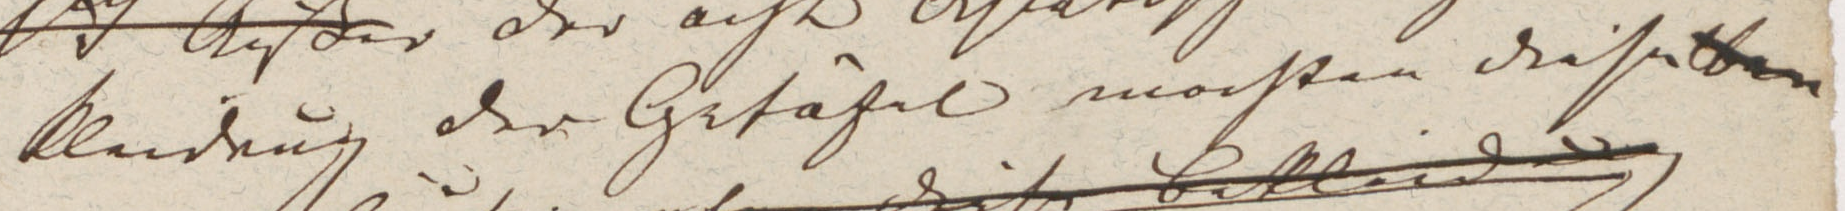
kleidung der Getäfel mochten dieselben
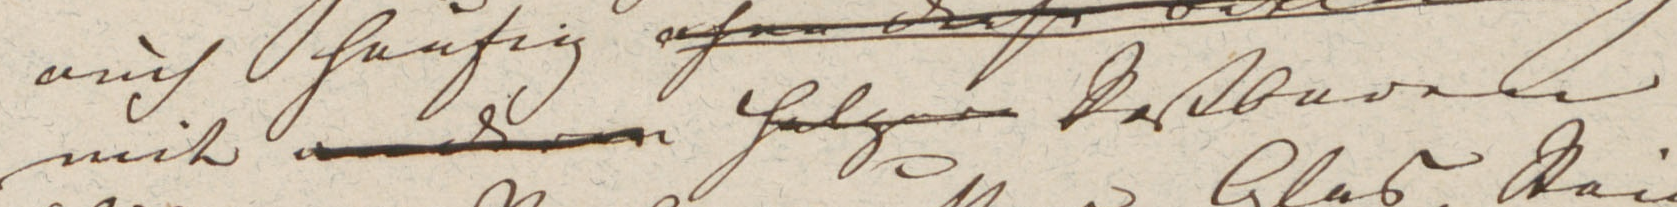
mit anderen Holzer kostbaren
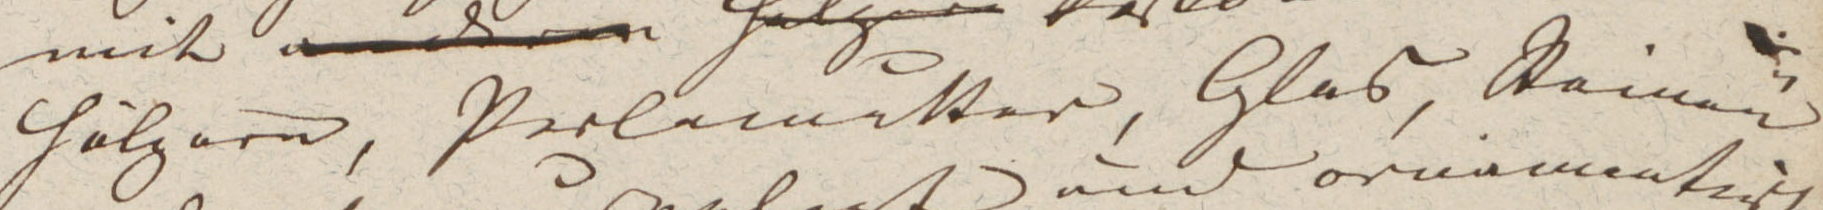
Hölzern, Perlemutter, Glas, Steinen
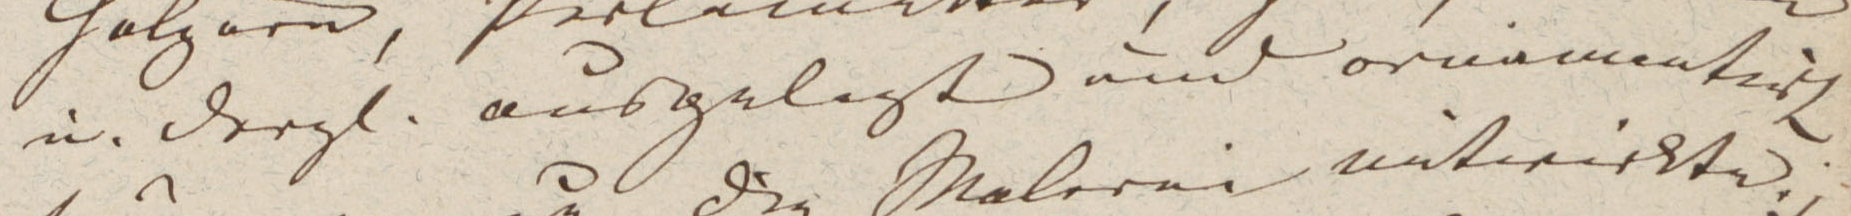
u. dergl. ausgelegt und ornamentirt
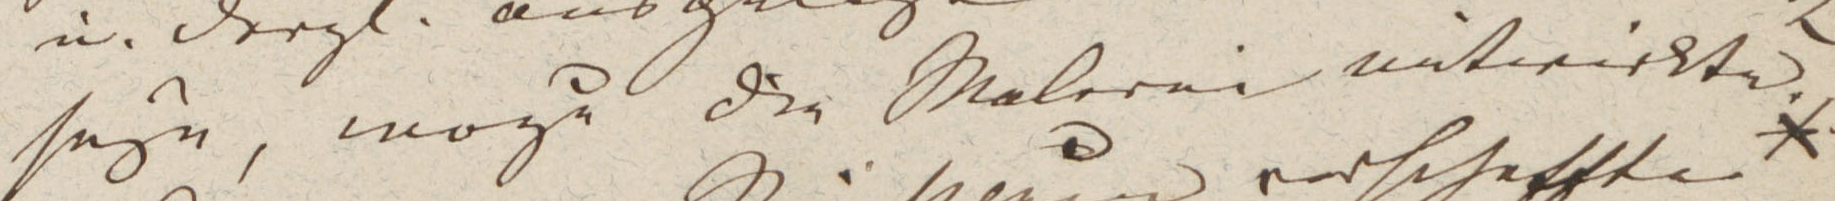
seyn, wozu die Malerei mitwirkte. %
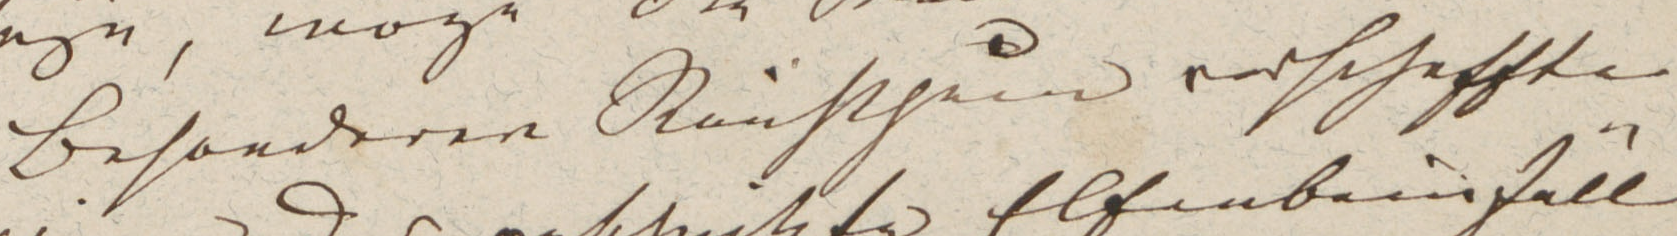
Besonderen Reichthum verschaffte
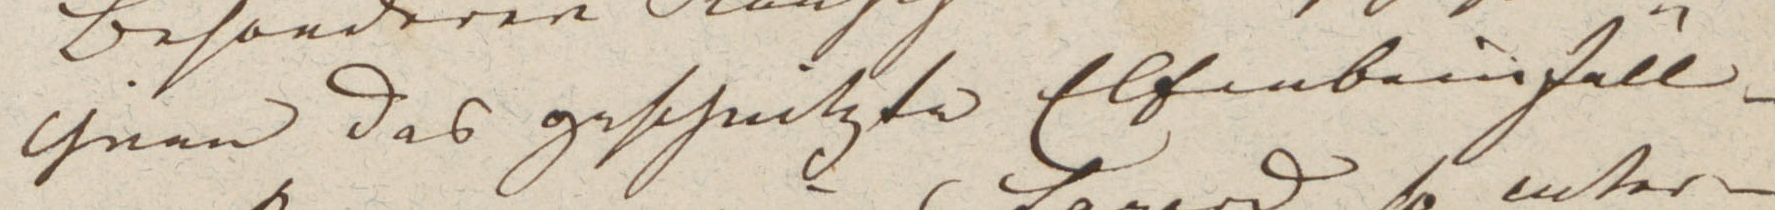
ihnen das geschnitzte Elfenbeinfüll-
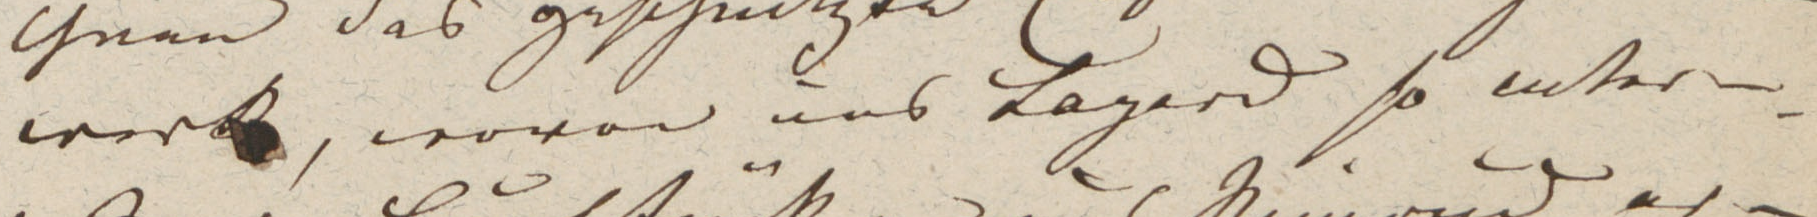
werk, wovon uns Layard so inter-
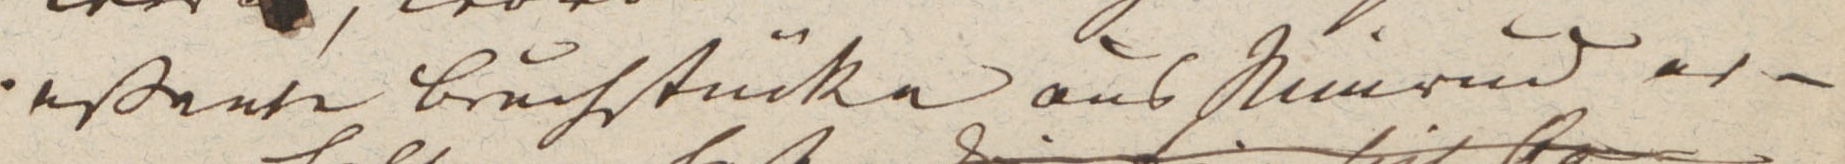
essante Bruchstücke aus Nimrud er-
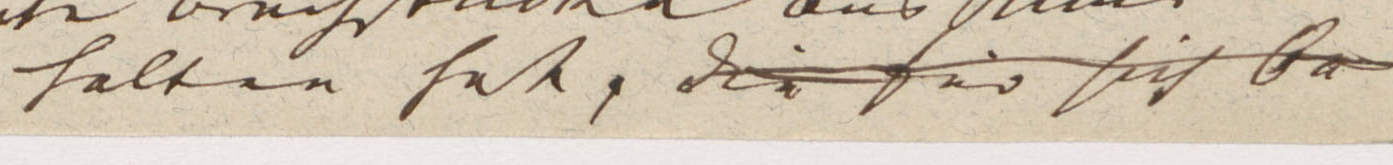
halten hat, die für sich be-
